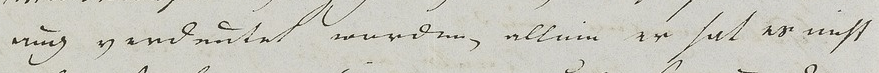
auch verdeutet worden, allein er hat es nicht
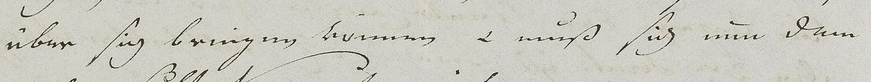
über sich bringen können & muß sich nun dem
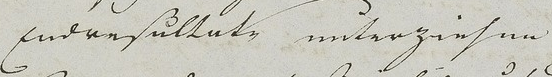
Endresultate unterziehen.
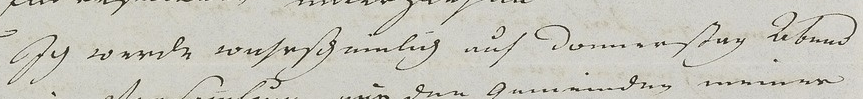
Ich werde wahrscheinlich auf Donnerstag Abend
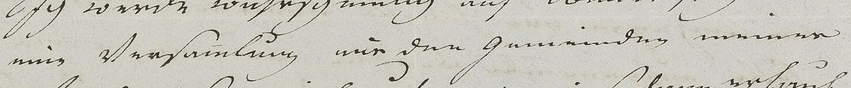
eine Versammlung aus den Gemeinden meines
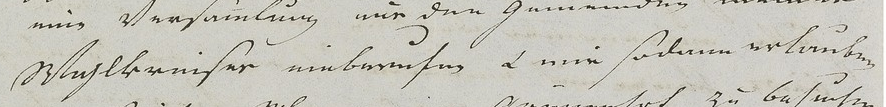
Wahlkreises einberufen & mir sodann erlauben
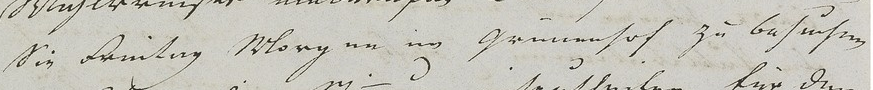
Sie Freitag Morgen im Grünenhof zu besuchen
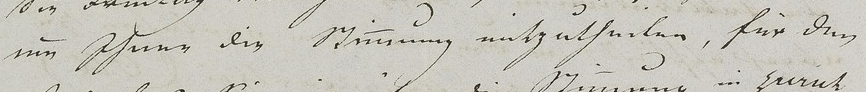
um Ihnen die Stimmung mitzutheilen, für den
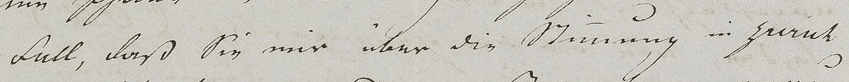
Fall, daß Sie mir über die Stimmung in Zürich
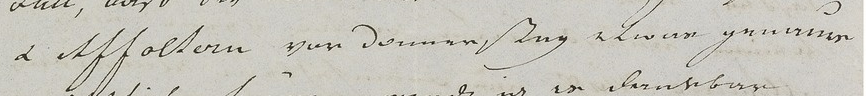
& Affoltern vor Donnerstag etwas genaues
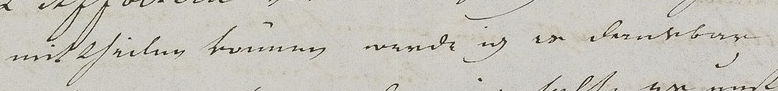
mittheilen können werde ich es dankbar
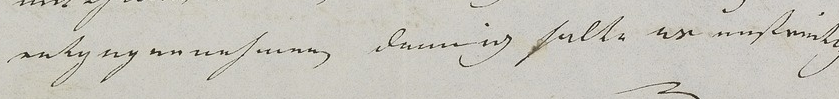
entgegennehmen denn ich halte es unstreitig
